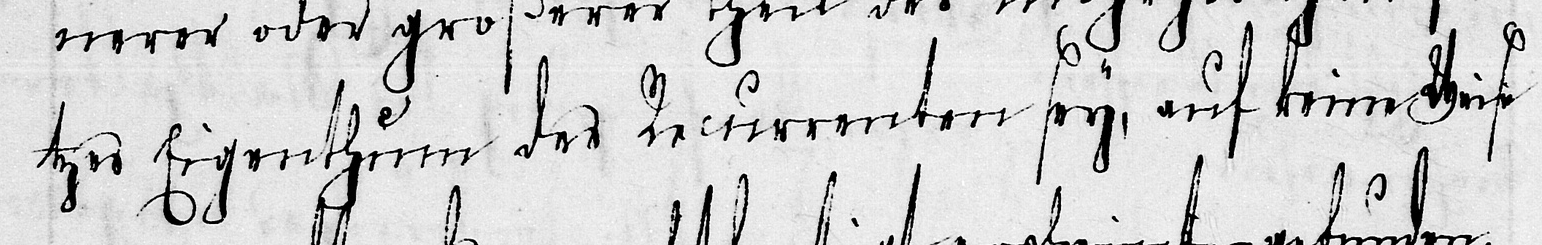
tzes Eigenthum des Recurrenten sey, auf keine Weise
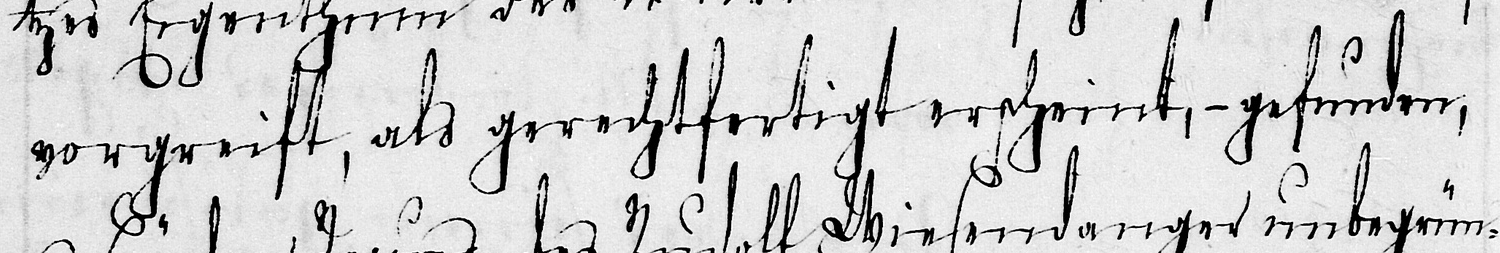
vorgreift, als gerechtfertigt erscheint, – gefunden,
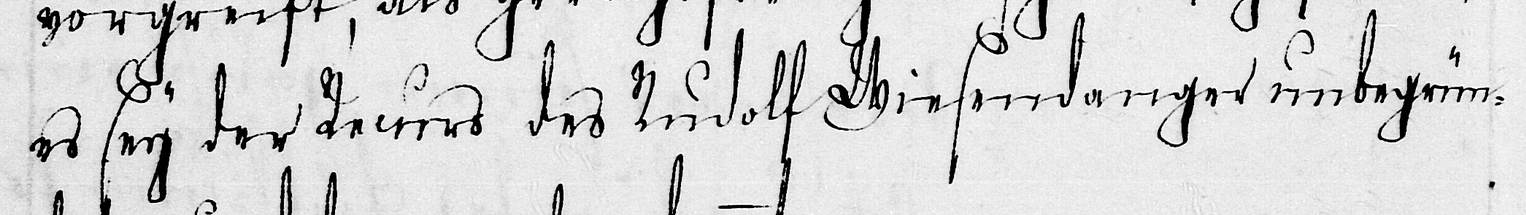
es sey der Recurs des Rudolf Wiesendanger unbegrün¬
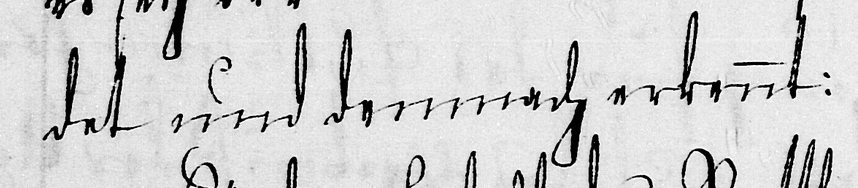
det und demnach erkennt:
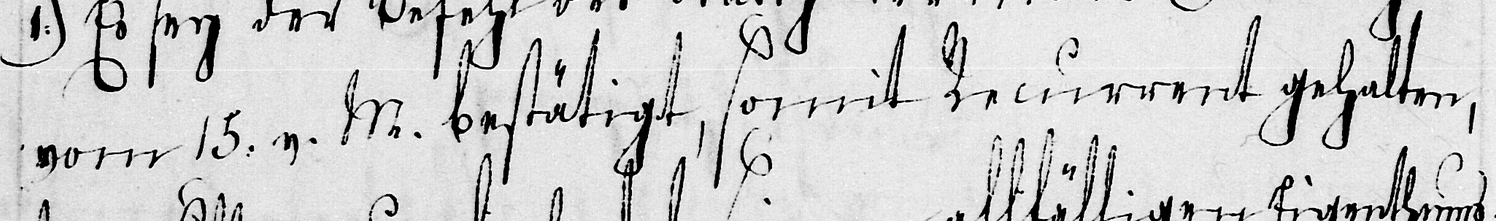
vom 15. v. M. bestätigt, somit Recurrent gehalten,
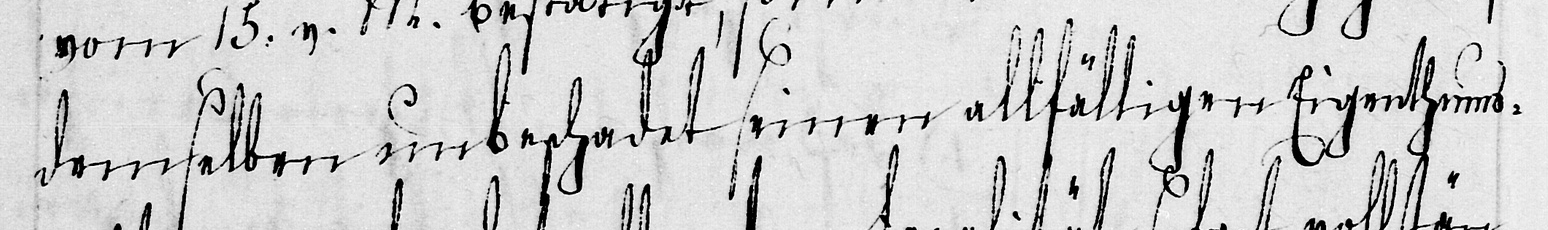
demselben unbeschadet seinen allfälligen Eigenthums¬
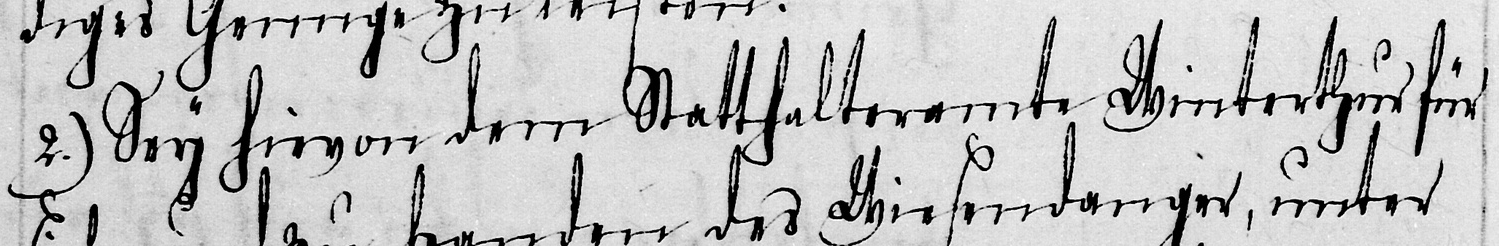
2.) Sey hievon dem Statthalteramte Winterthur für
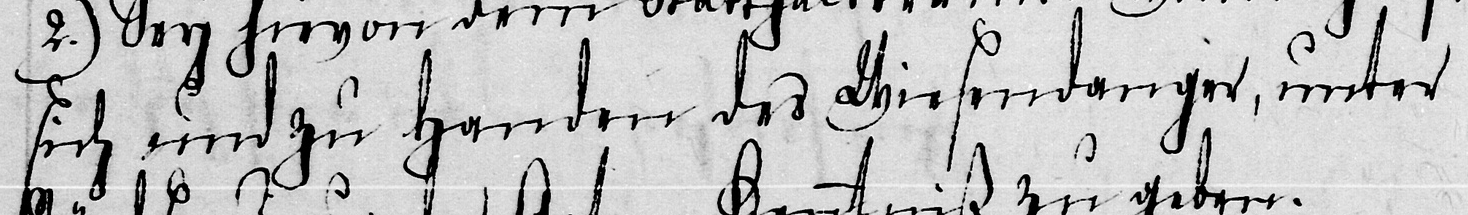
sich und zu Handen des Wiesendanger, unter
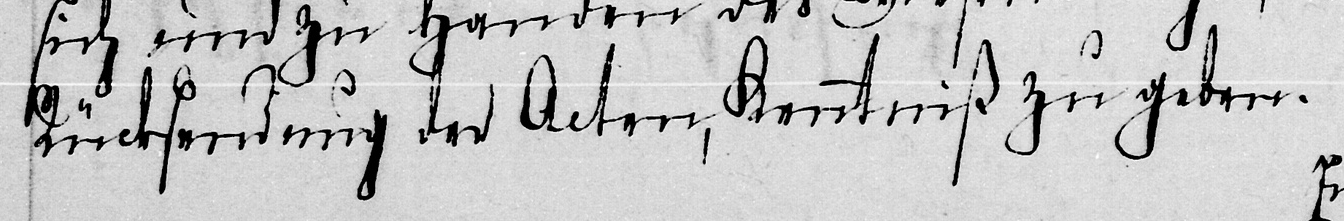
Rücksendung der Acten, Kenntniß zu geben.
